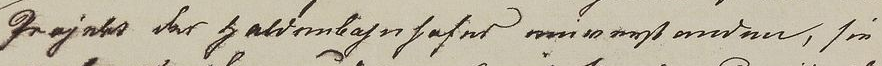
Projekt des Haldenbahnhofes einverstanden, sie
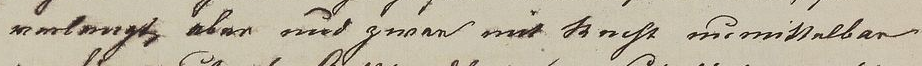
verlangt aber und zwar mit Recht unmittelbar
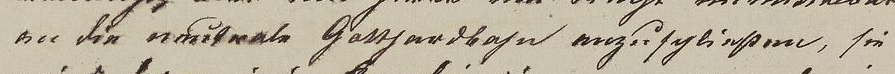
an die neutrale Gotthardbahn anzuschließen, sie
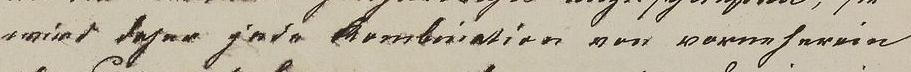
wird daher jede Kombination von vorneherein
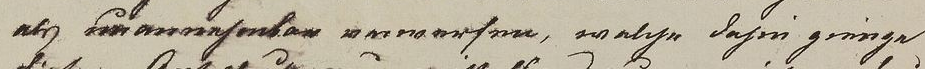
als unannehmbar verwerfen, welche dahin gienge
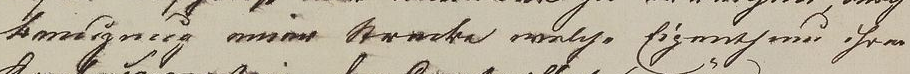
Benuzung einer Strecke welche Eigenthum ihrer
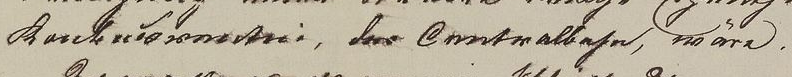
Konkurrentin, der Centralbahn, wäre. –
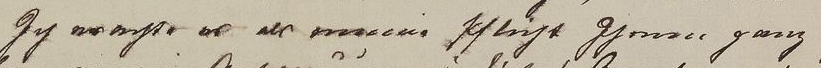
Ich erachte es als meine Pflicht Ihnen ganz
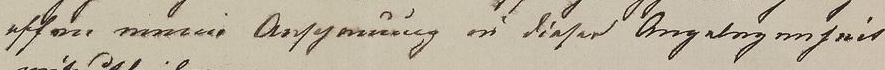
offen meine Anschauung in dieser Angelegenheit
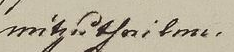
mitzutheilen. –
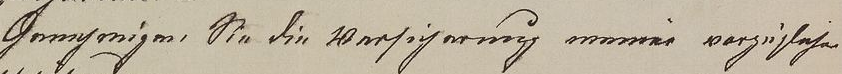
Genehmigen Sie die Versicherung meiner vorzüglichen
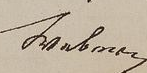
Weber
